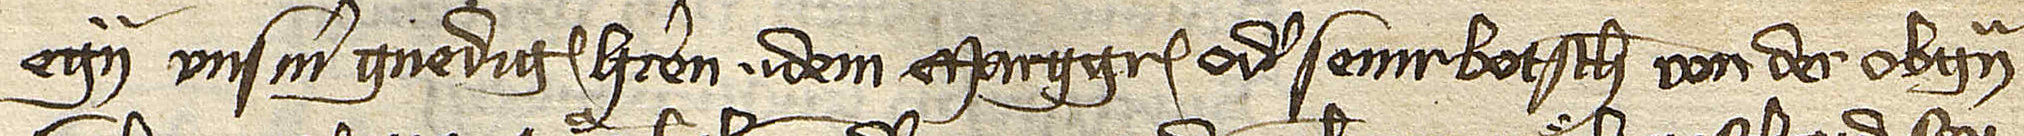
egn* vnſm* gnedig* h*ren ~ dem Marggr* od* ſeinr botſch* von der obgn*
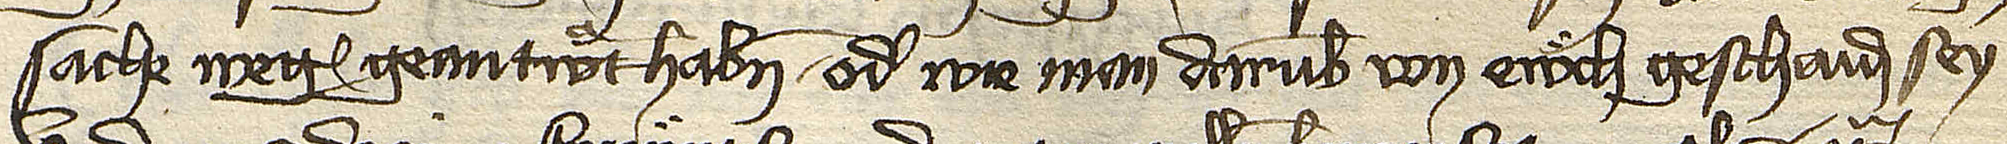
ſache weg* geantw*t habn* / od* wie man darub* von eẅch geſchaid* ſey
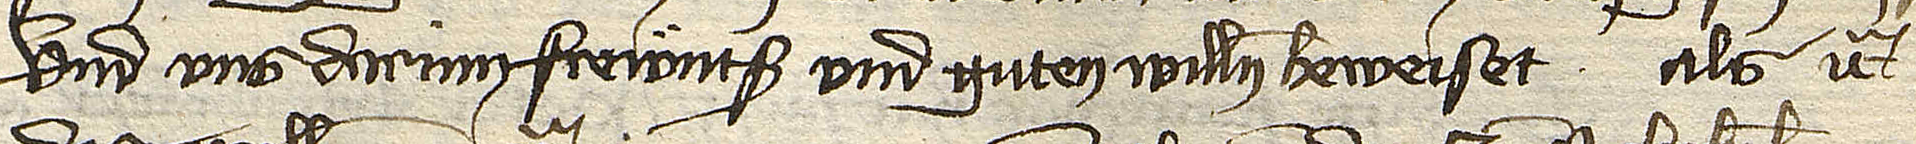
Vnd vns darinn freẅntſ* vnd guten willn* beweiſet . als ec*
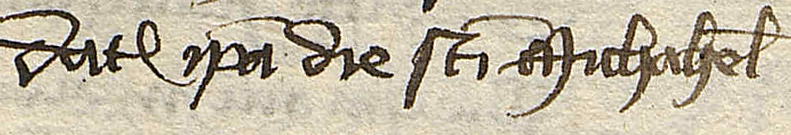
Dat* ipa* die ſ*ci Michahel*
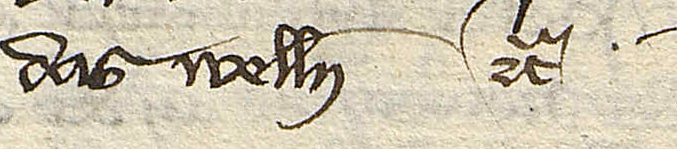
das welln* ec* .
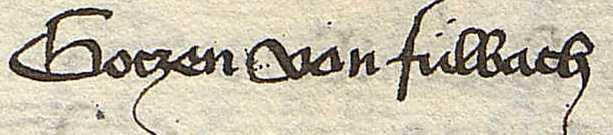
Gocʒen von fülbach
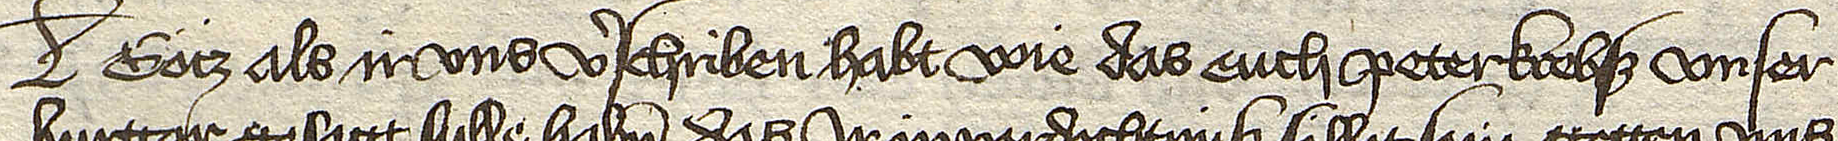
L* Göcʒ als ir vns v*ſchriben habt wie das euch peter krebſʒ vnſer
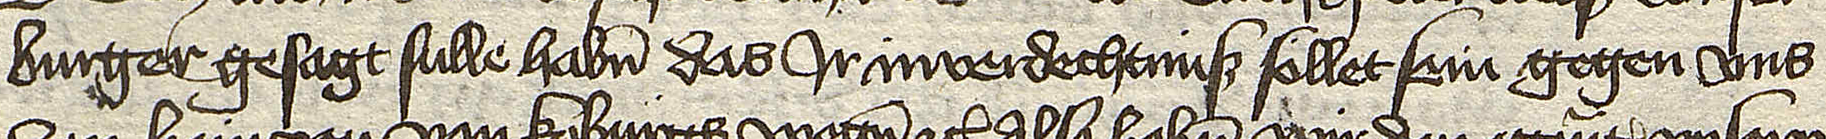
burger geſagt ſulle habn* das Ir in verdechtnuſʒ ſöllet ſein gegen vns
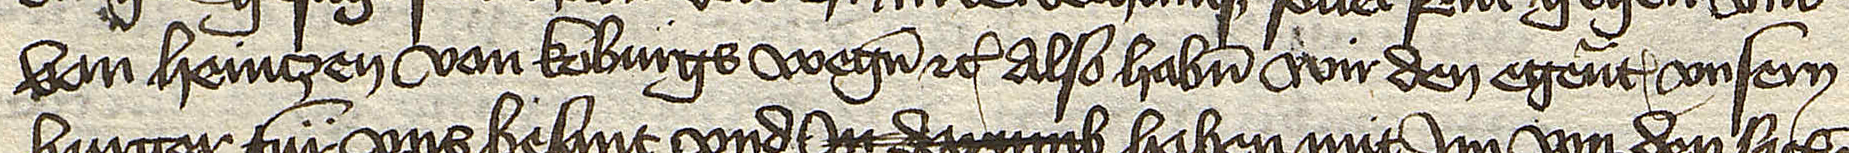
von heincʒen von koburgs wegn* ec* Alſo habn* wir den egent* vnſern
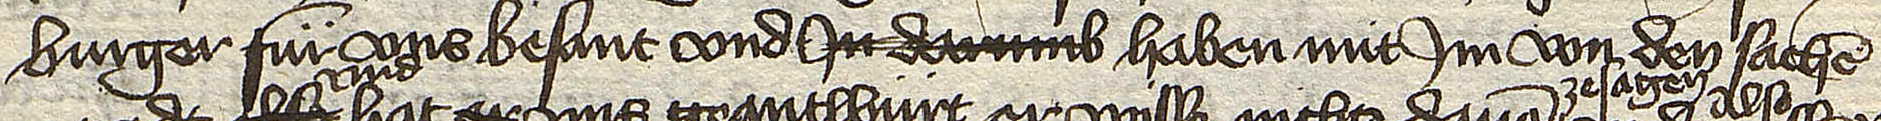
burger für vns beſant vnd In darumb haben mit Im von den ſache*
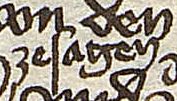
ʒeſagen
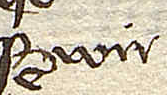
wir
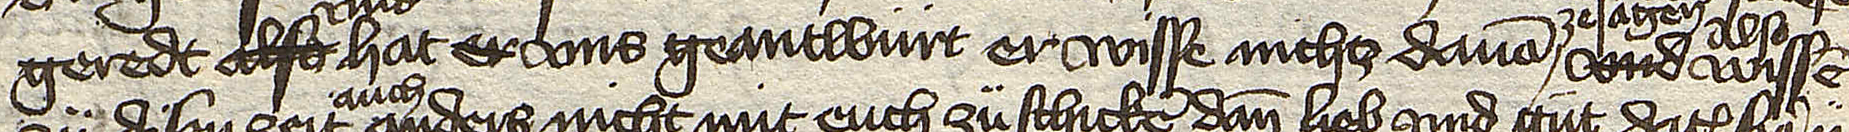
geredt alſo hat er vns geantwürt er wiſſe nichcʒ dauo* vnd wiſſe*
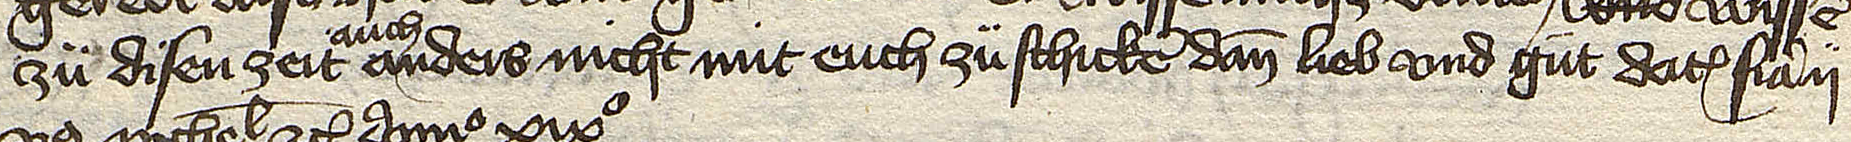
cʒü diſen ʒeit anders nicht mit euch cʒü ſchicke* dan* lieb vnd güt dat* fia* ii
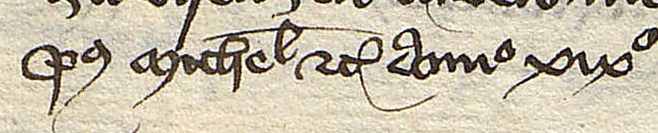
p* Michel* ec* Dom* xix*
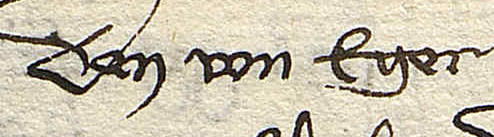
Den von Eger
